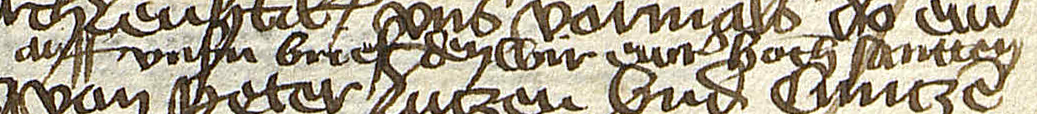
auff vnſ*n brief den wir ew*r hoch* ſantten
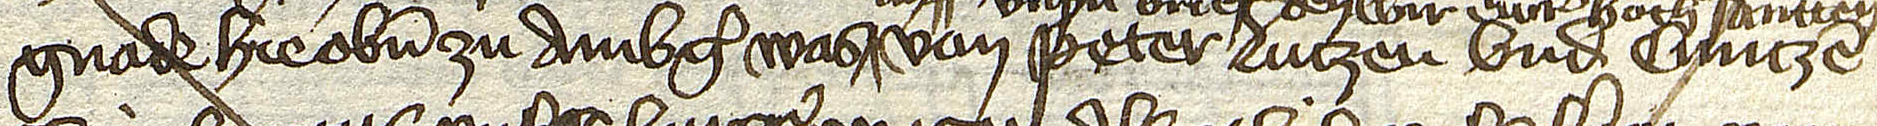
gnade hie obn* ʒu Amb*g was von Peter Lucʒen vnd Cuncʒe*
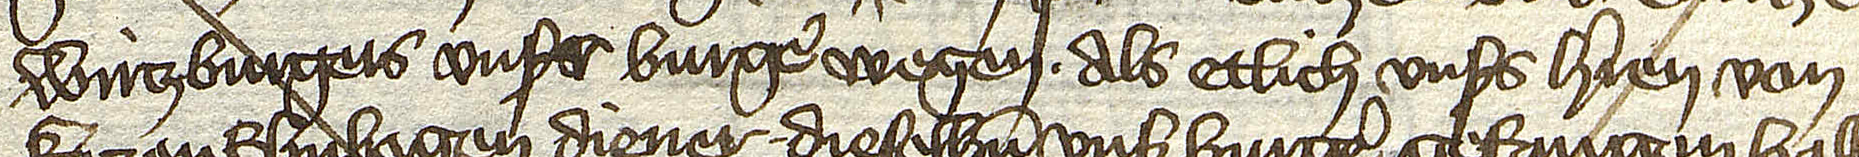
Wircʒburgers vnſ*r burge* wegen . Als etlich vnſ*s h*ren von
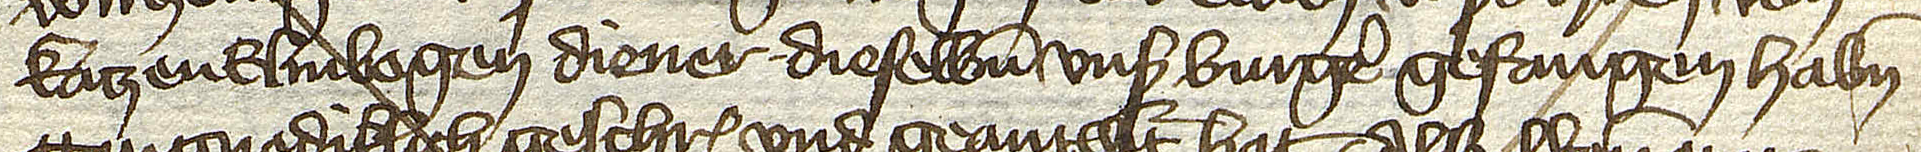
kacʒen Elmbogen diener . dieſelb*n vnſ* burge* gefangen hab*n
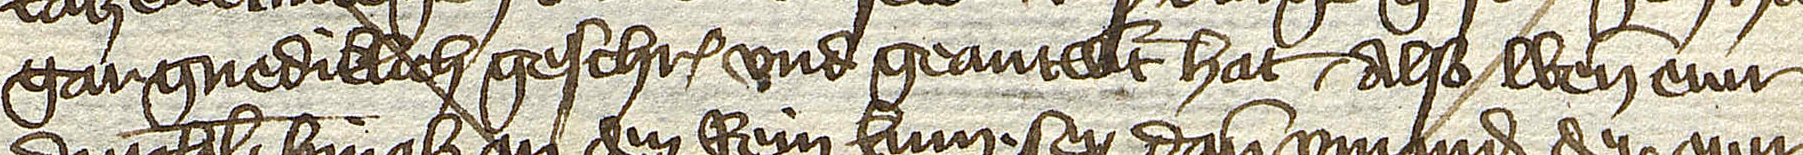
gar gnediklich geſchr* vnd geantw*t hat / Alſo wen* ewr
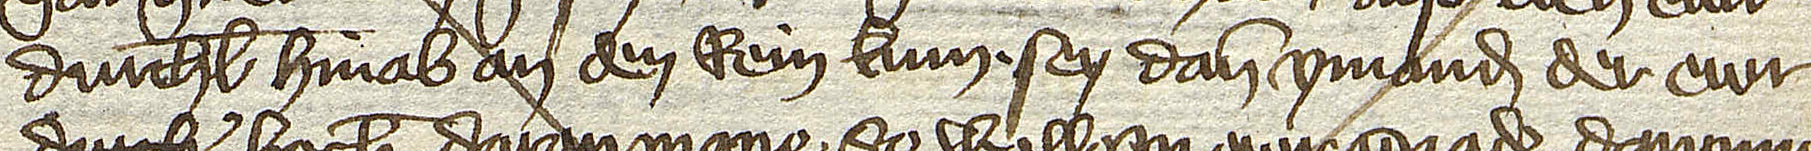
durchl* hinab an den Rein kum . ſey dan* ymand* der ewr
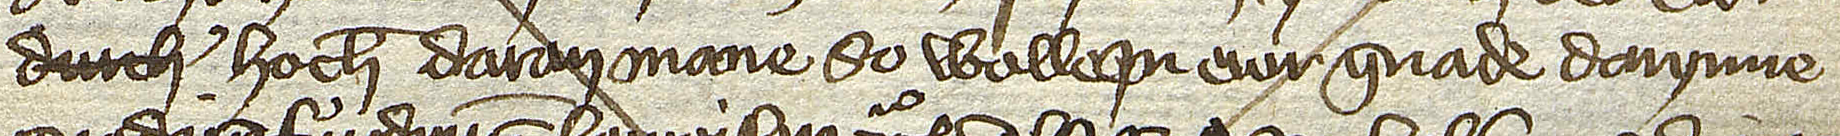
durch* . hoch* daran mane So wolle In ewr gnade darynne
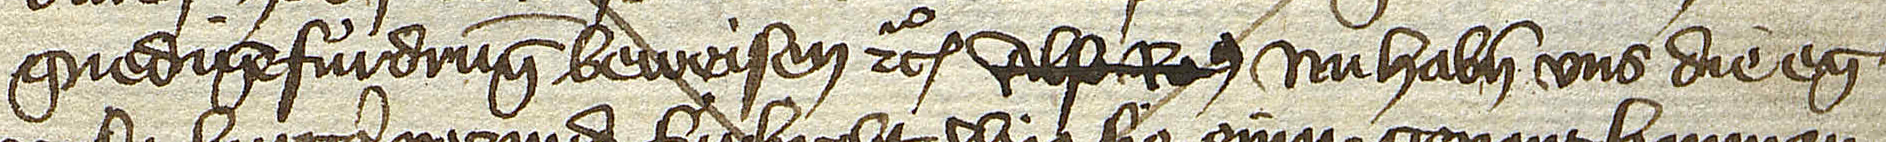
gnedige fürdru*g beweiſen ec* Alſo Ro* Nu hab*n vns die eg*
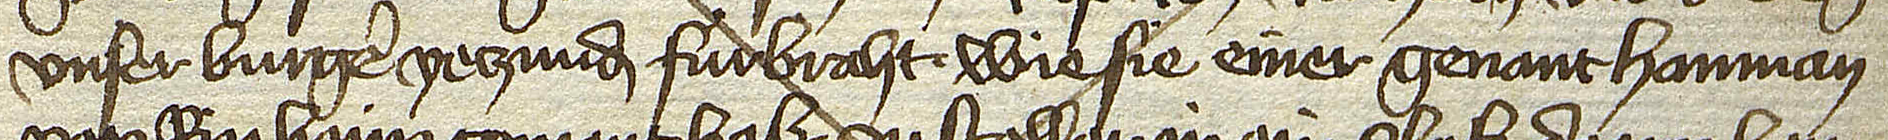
vnſer burge* yecʒund* fürbraht . wie ſie einer gennt hanman
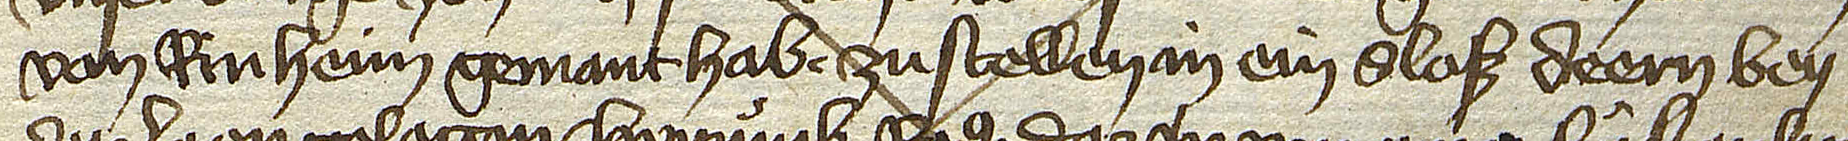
von Rinheim gemant hab . ʒu ſtellen in ein Sloſʒ deern bey
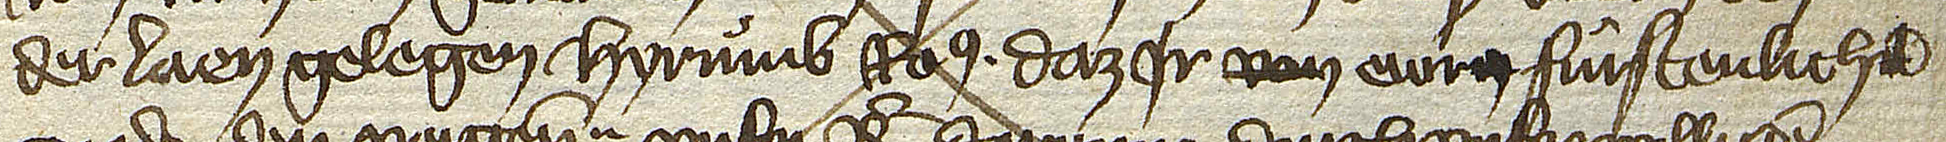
der laen gelegen / hyrümb Ro* daʒ Ir von ewrn fürſtenlichn*
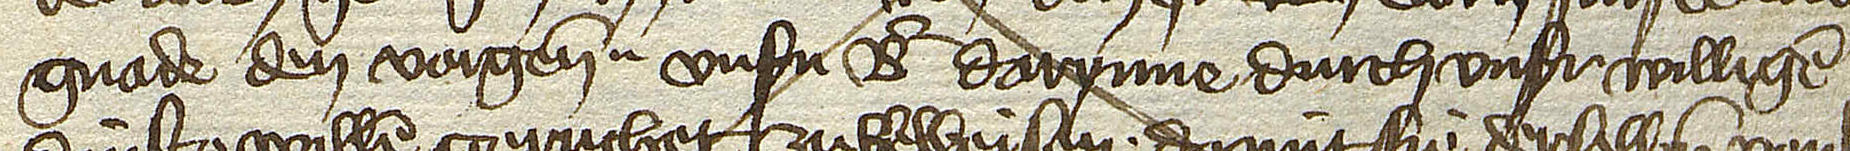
gnade den vorgen* ~ vnſ*n B* darynne durch vnſ*r willige*
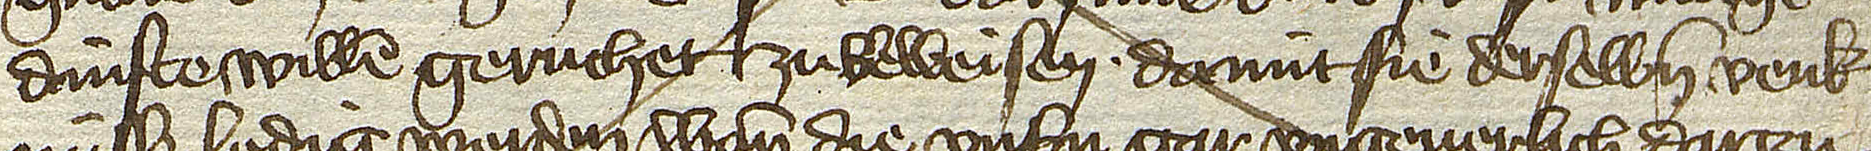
dinſte wille* geruchet ʒu beweiſen . damit ſie derſelb*n venk
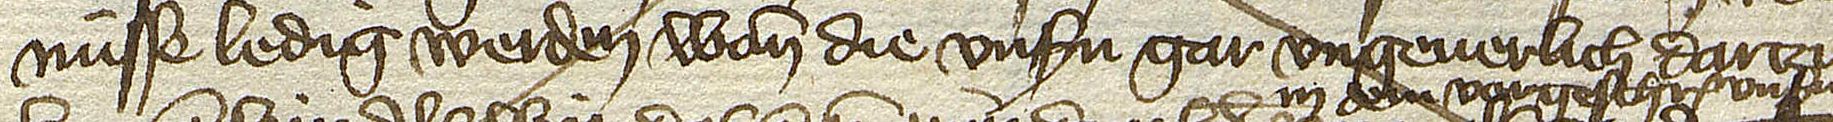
nüſſe ledig werden / wan* die vnſ*n gar vngeuerlich darcʒu
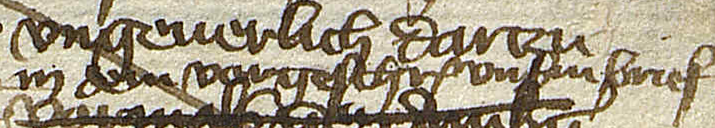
in dem vorgeſchr* vnſ*m brief
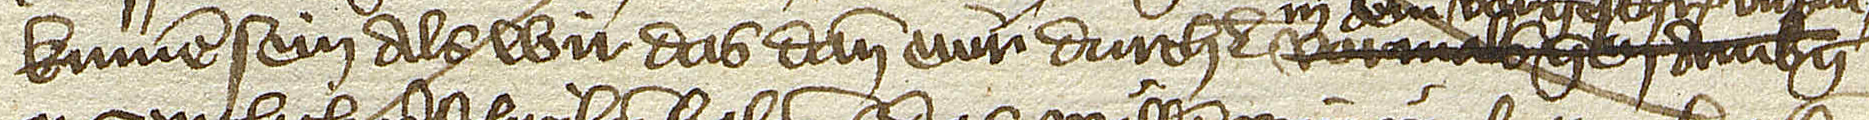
kume* ſein Als wir das dan* ew*r durchl* vormals gen Amb*g
